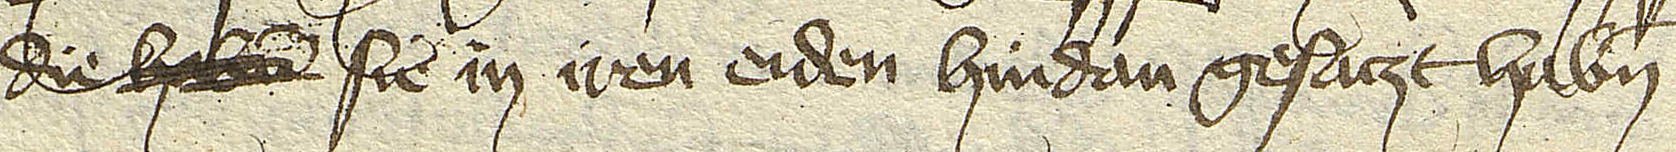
die habn* ſie in iren eiden hindan geſacʒt habn*
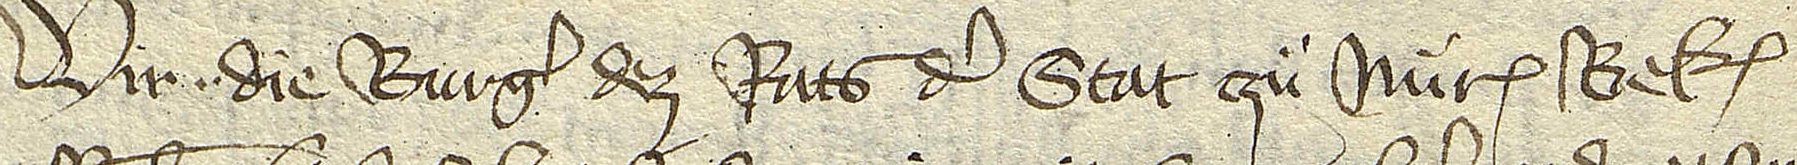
Wir ~ die Burg* deʒ Rats d* Stat cʒü Nür* Bek*
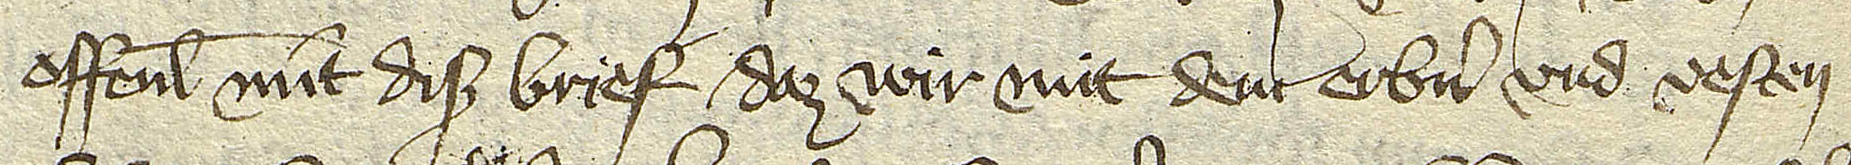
offenl* mit diſʒ brief / daʒ wir mit dem erbn* vnd veſten
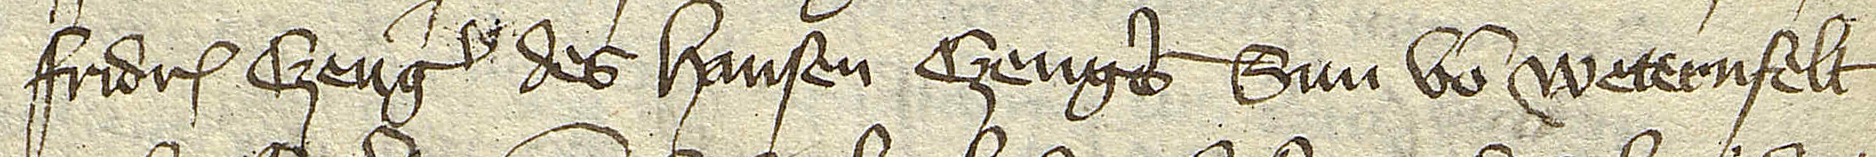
Fridr* Cʒeng* des Hanſen Cʒeng*s Sun vo* weternfelt
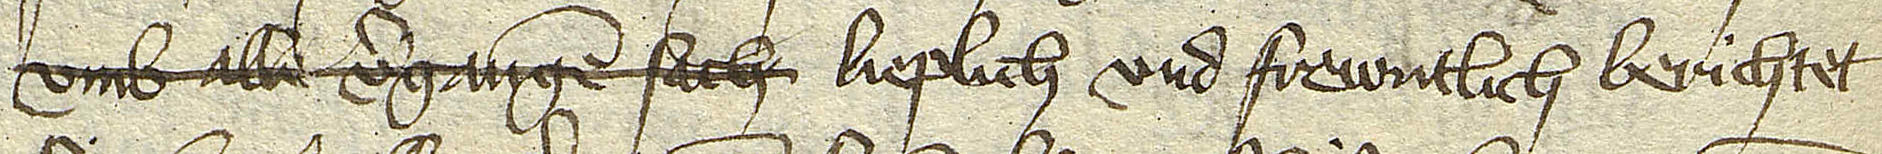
vmb alle v*gange* ſach lieplich vnd frewntlich berichtet
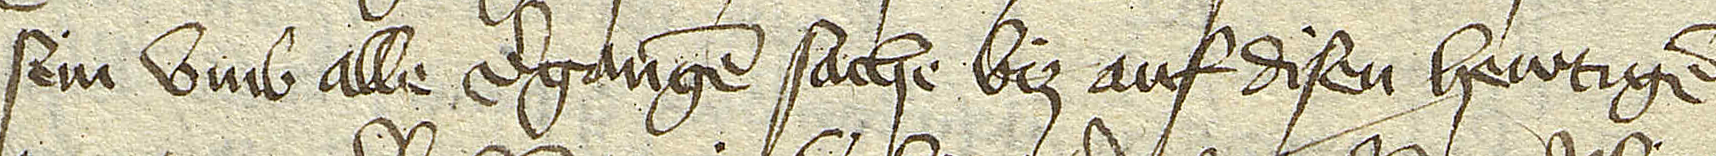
ſein vmb alle v*gange* ſache biʒ auf diſen hewtige*
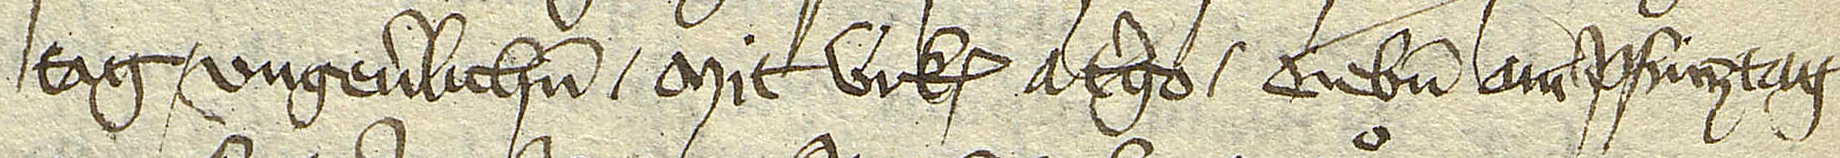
tag vngeu*lichn* / Mit vrk* at*go / Gebn* am Pfincʒtag
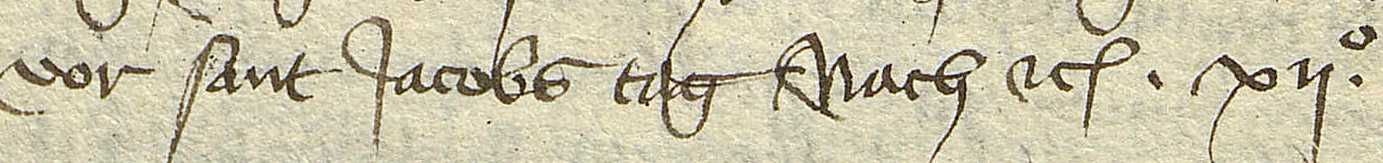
vor ſant Iacobs tag / Nach ec* . xii* .
